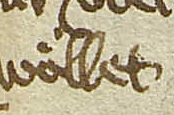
wöllet
